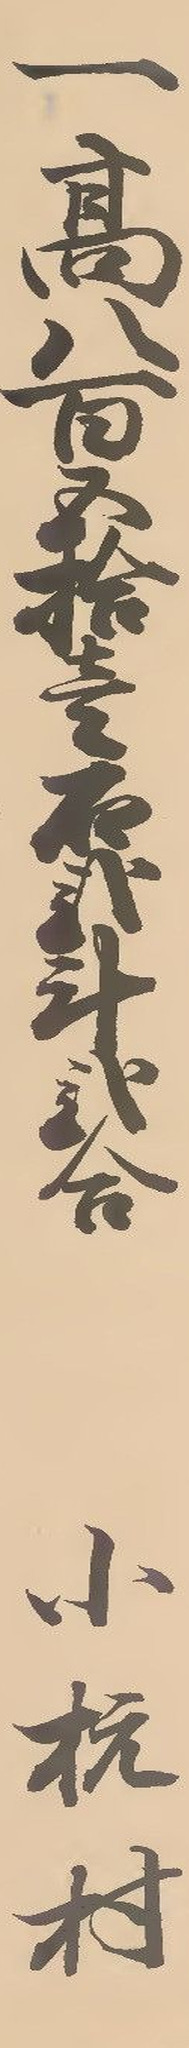一髙八百五拾壱石弐斗弐合小村
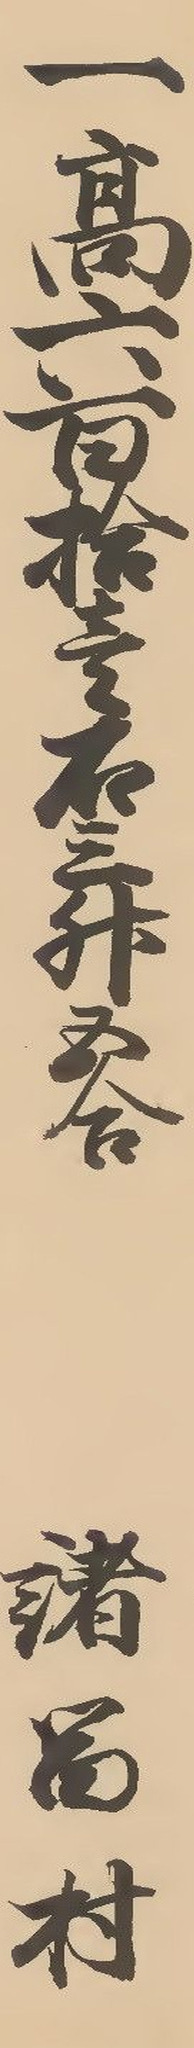一髙六百拾壱石三升五合諸冨村
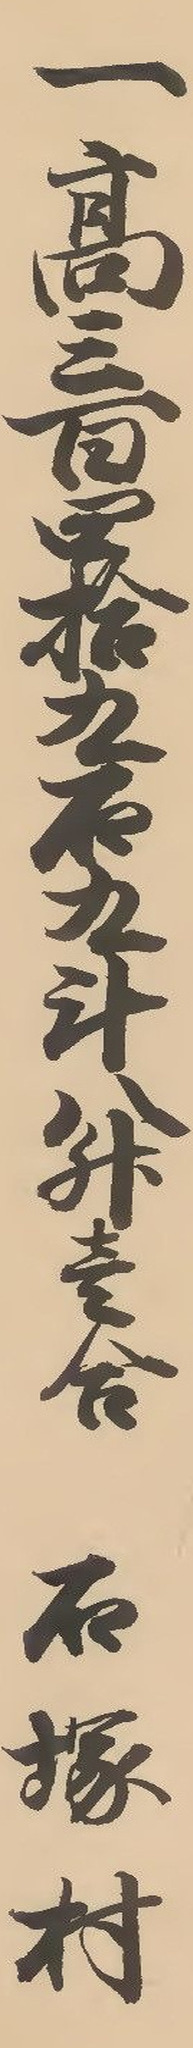一髙三百四拾九石九斗八升壱合石塚村
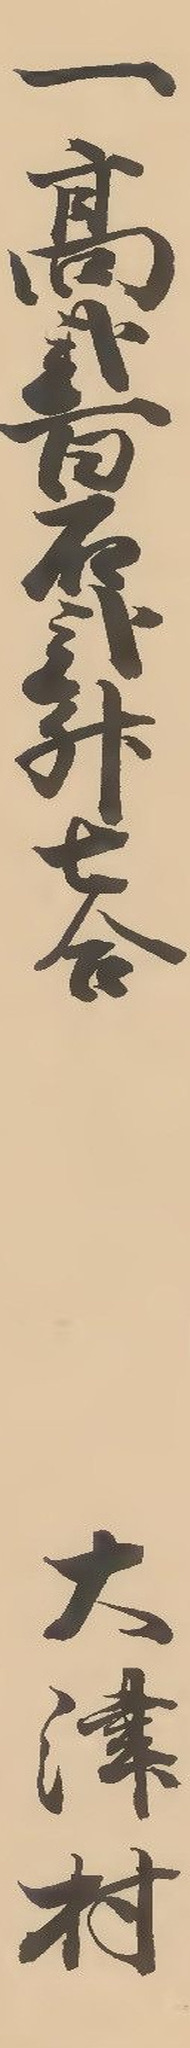一髙弐百石弐升七合大津村

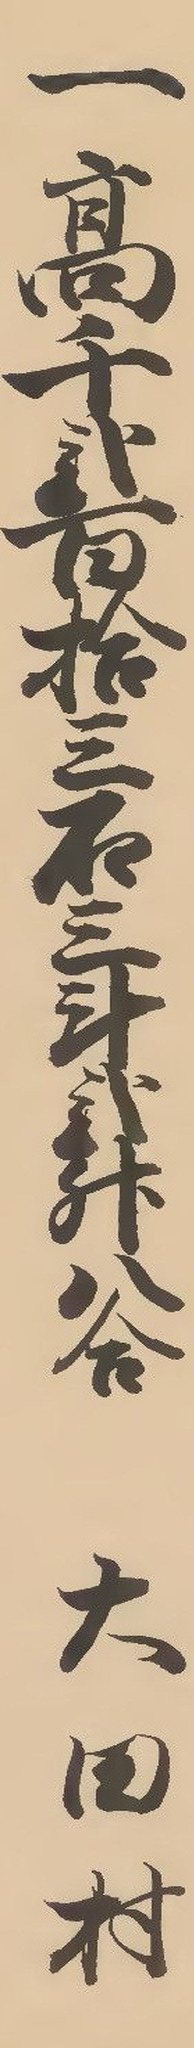一髙千弐百拾三石三斗弐升八合大田村
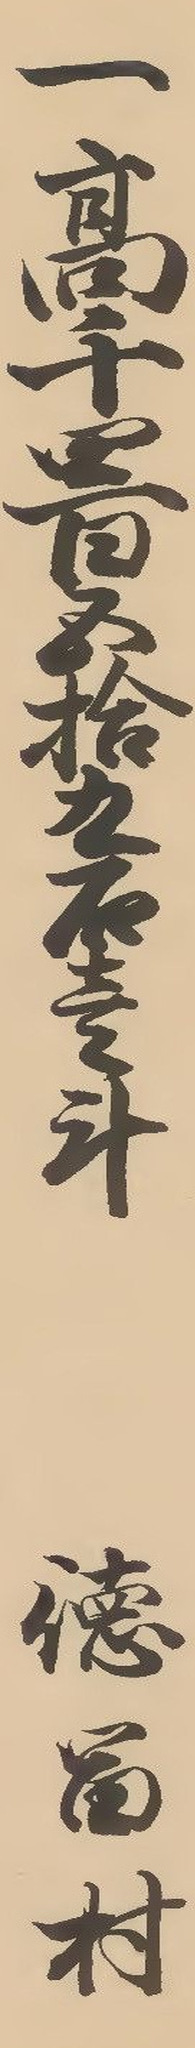一髙千四百五拾九石壱斗徳冨村
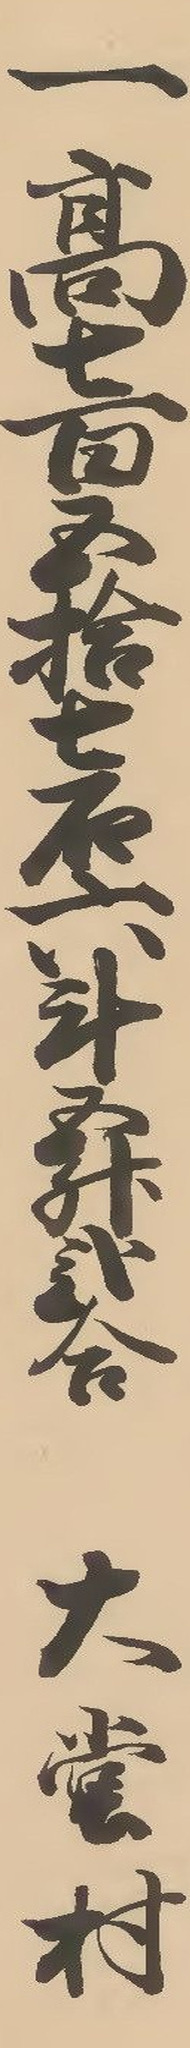一髙七百五拾七石六斗五升弐合大堂村
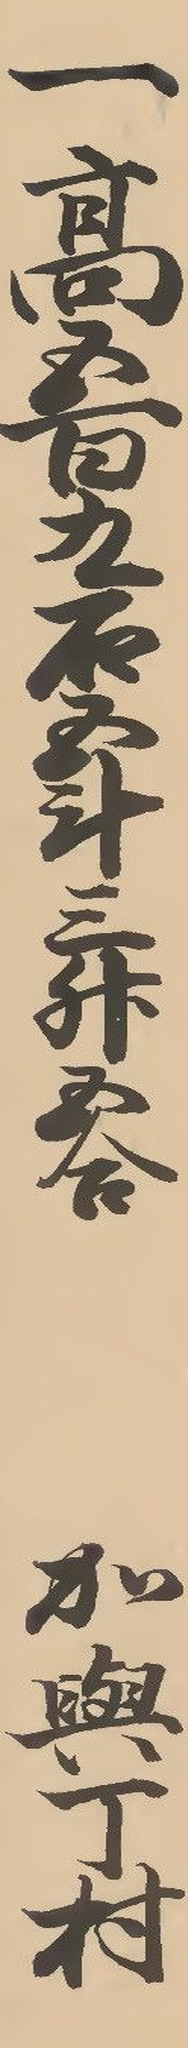一髙五百九石五斗三升五合加與丁村
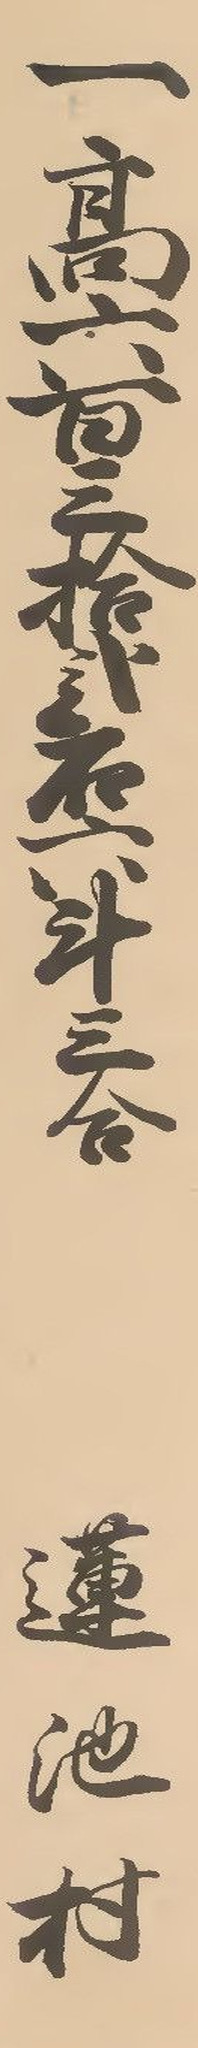一髙六百三拾弐石六斗三合蓮池村
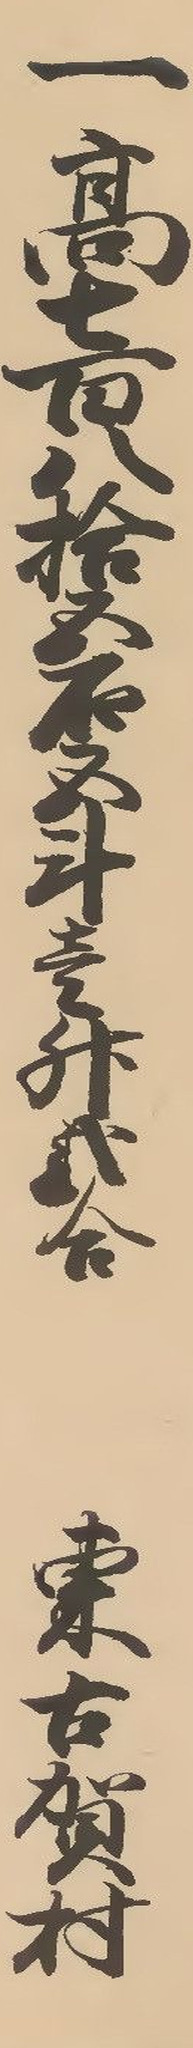一髙七百八拾五石五斗壱升弐合東古賀村
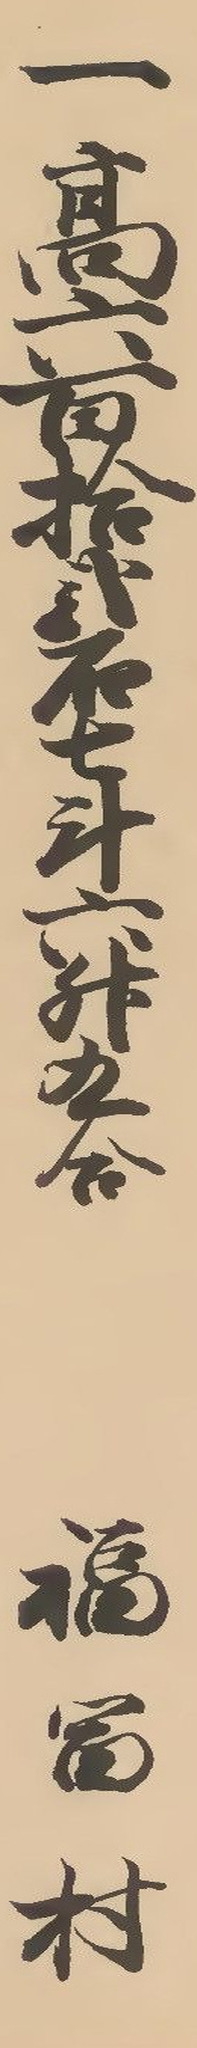一髙六百拾弐石七斗六升九合福冨村
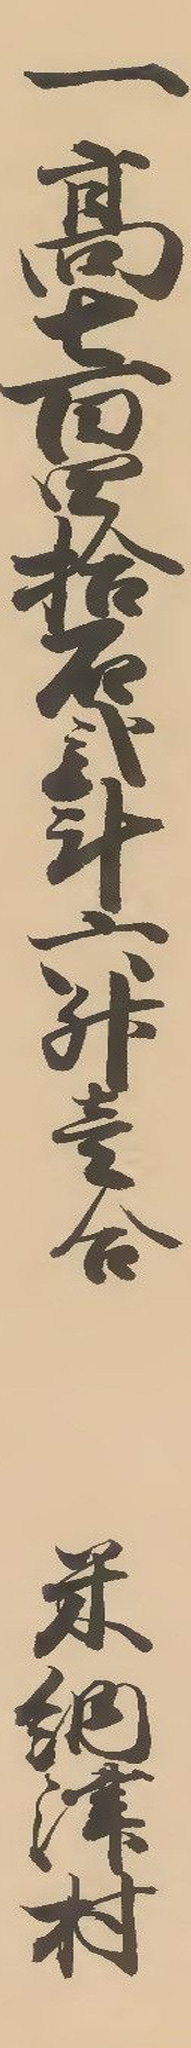一髙七百四拾石弐斗六升壱合米納津村

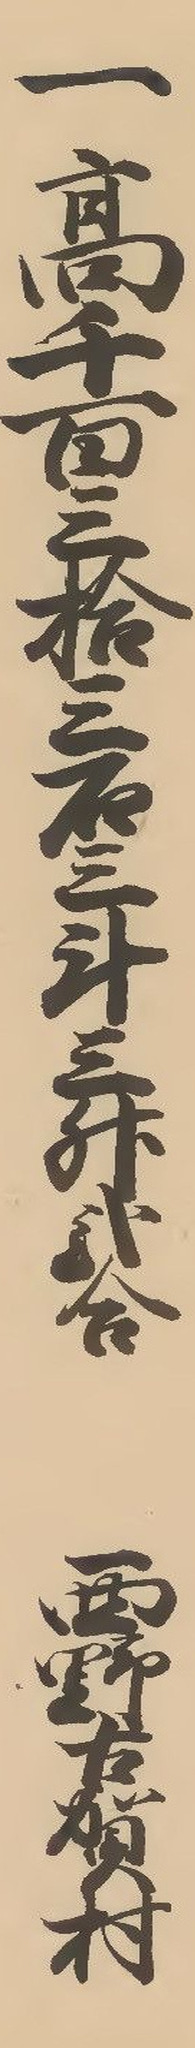一髙千百三拾三石三斗三升弐合西野古賀村
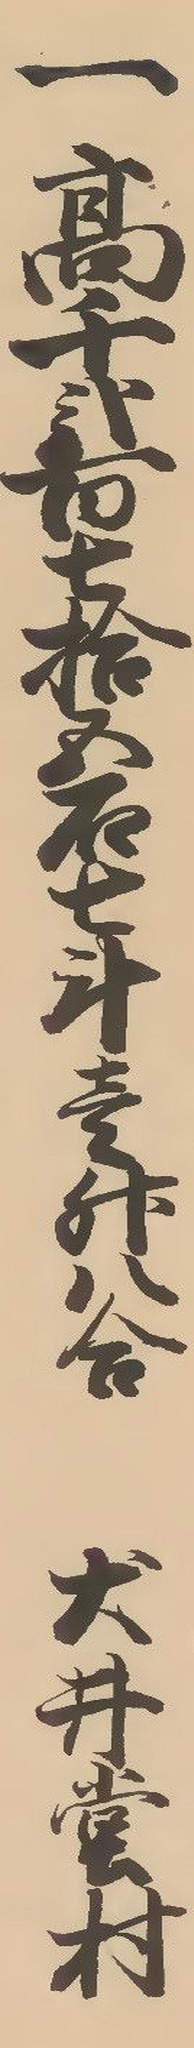一髙千二百七拾五石七斗壱升八合犬井堂村
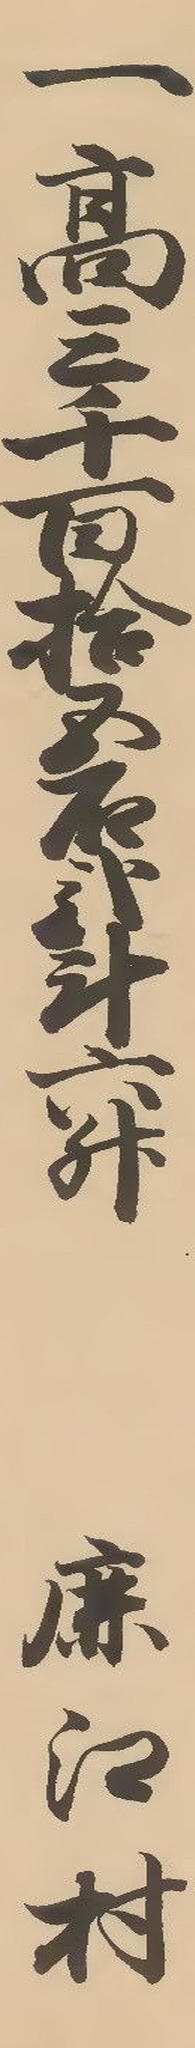一髙三千百拾五石弐斗六升鹿江村
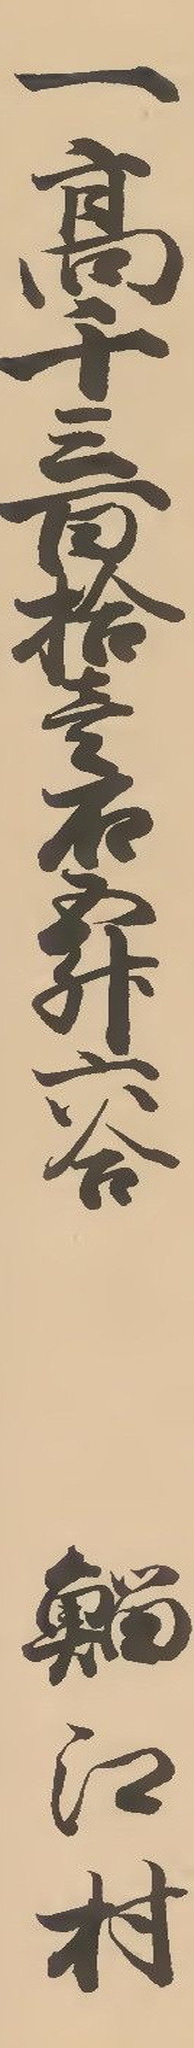一髙千三百拾壱石五升六合江村
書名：肥前国郷帳
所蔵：国立公文書館 National Archives of Japan
